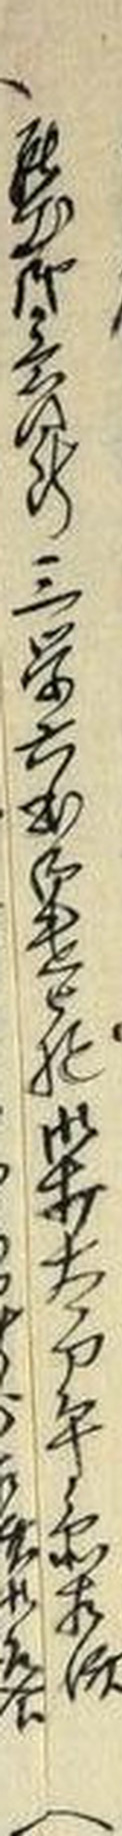罷出御意同断三学六本御遣被遊御打太刀平兵衛相済
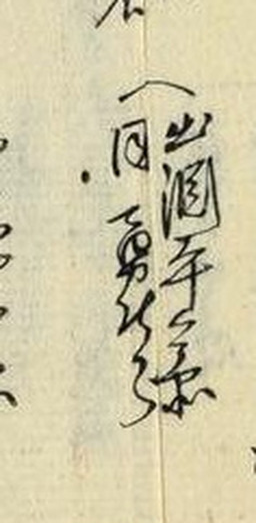同勇次郎
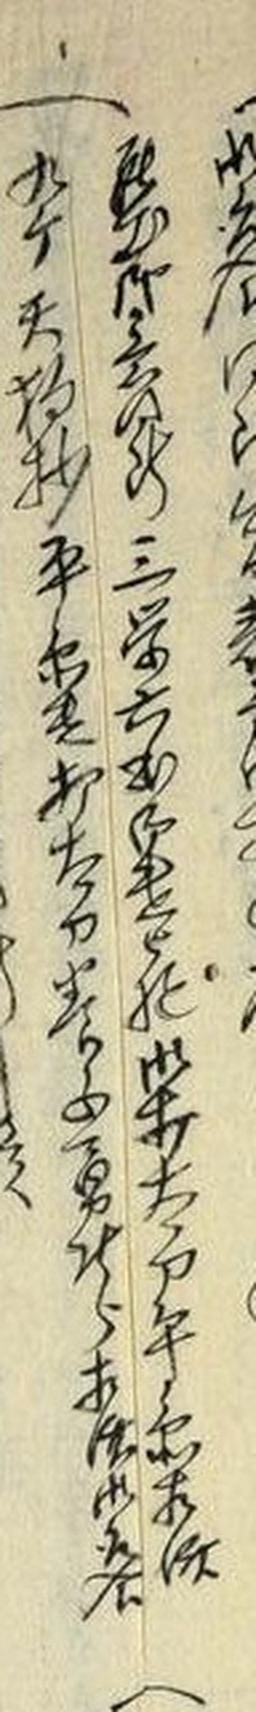九ヶ天狗抄平兵衛遣打太刀養子勇次郎相済御取合
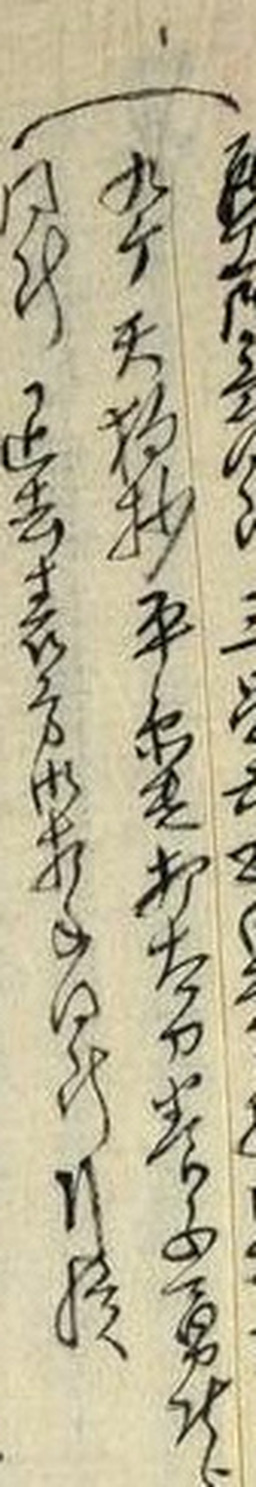同断退去表方御相手同断引続
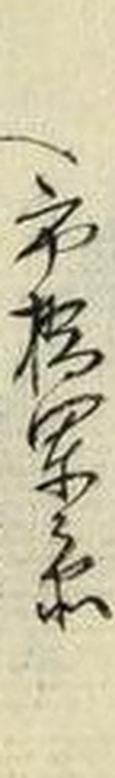市橋軍兵衛
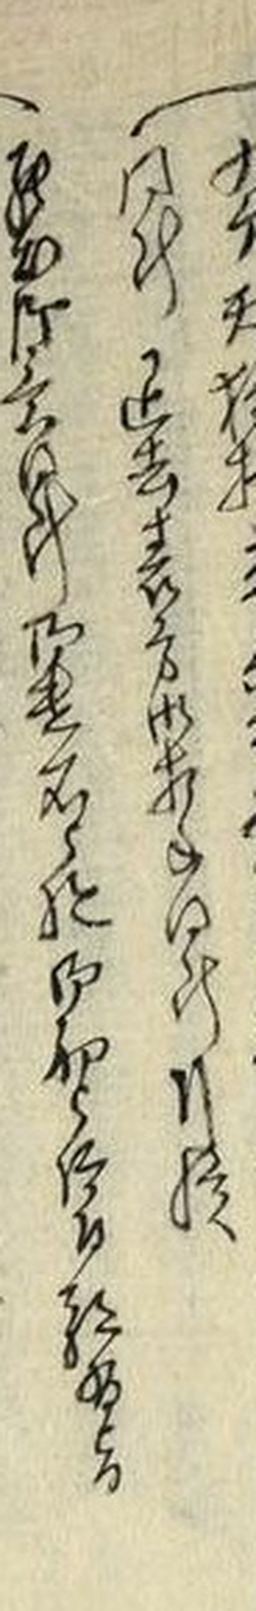罷出御意同断御遣不被遊御初被仰付難有旨
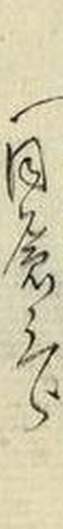同廉三郎
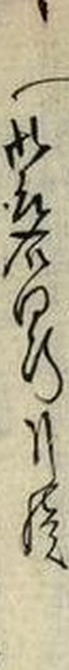御取合同断引続
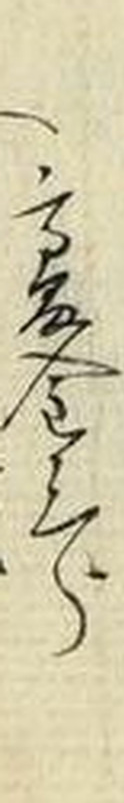高畠金三郎
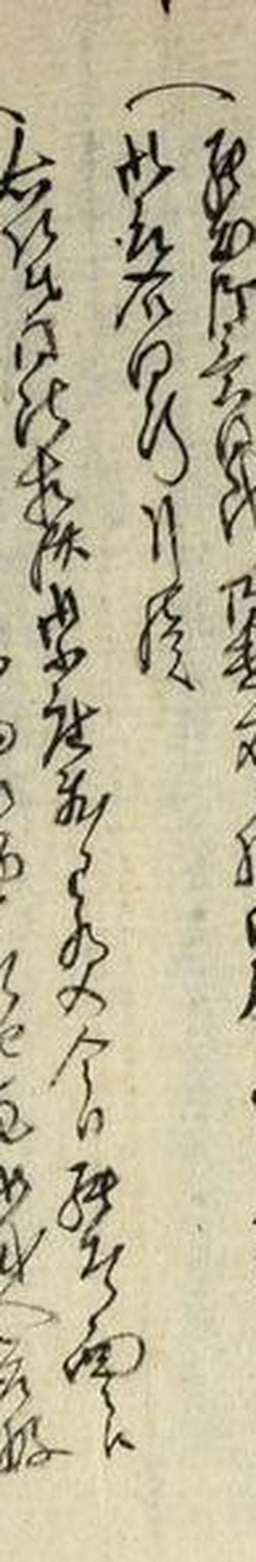右次第同断相済御小座敷へ被為入今日罷出候面々江
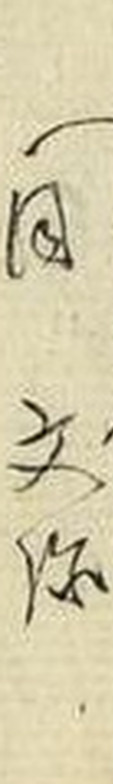同文弥
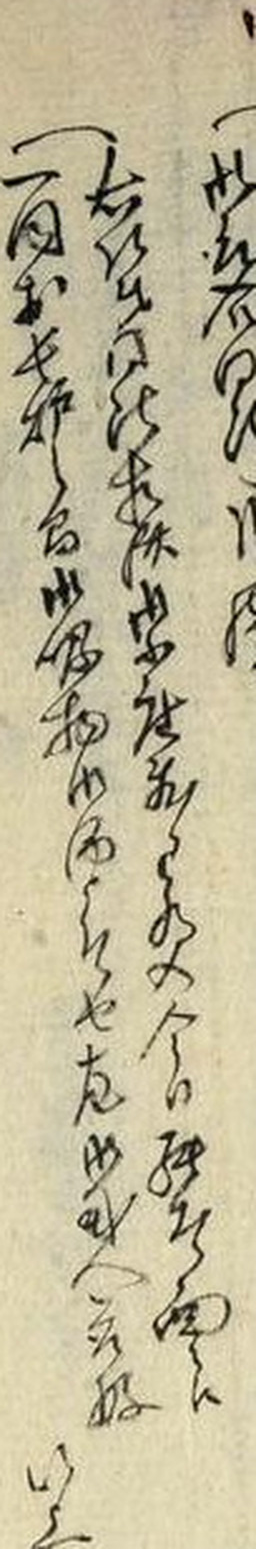一同於長炉之間御吸物御酒被下候由右御用人取扱

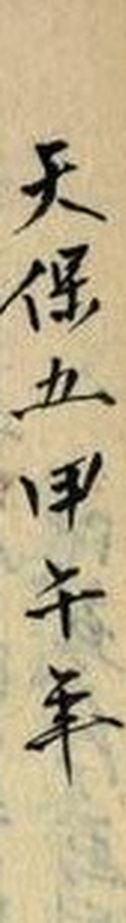天保五甲午年
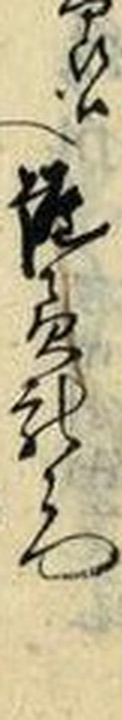渥美新右衛門
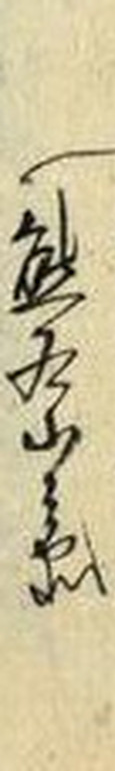熊谷小兵衛
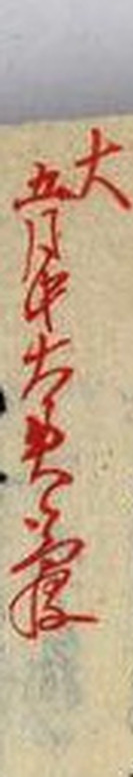五月中大奥御寝
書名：少傅日録抄（斉承付側向頭取日記、在国）
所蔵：福井県文書館 Fukui Prefectural Archives
